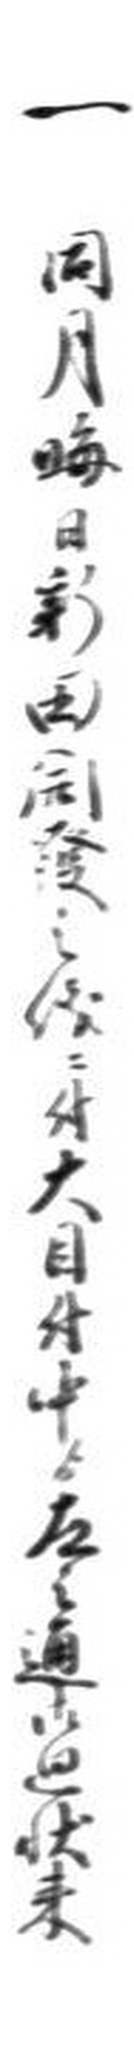一同月晦日新田開発之儀ニ付大目付中ゟ左之通御廻状来
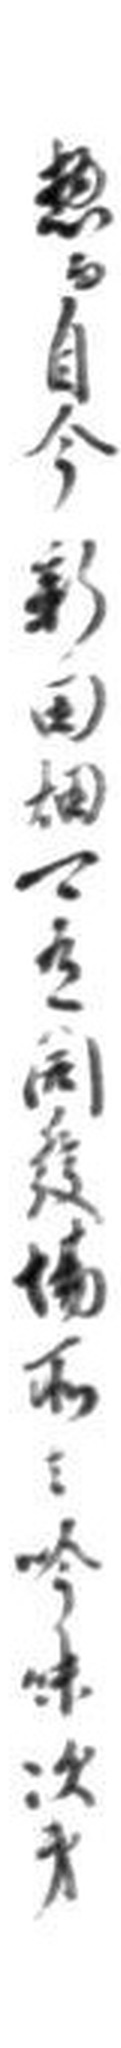惣而自今新田畑可有開発場所者吟味次第
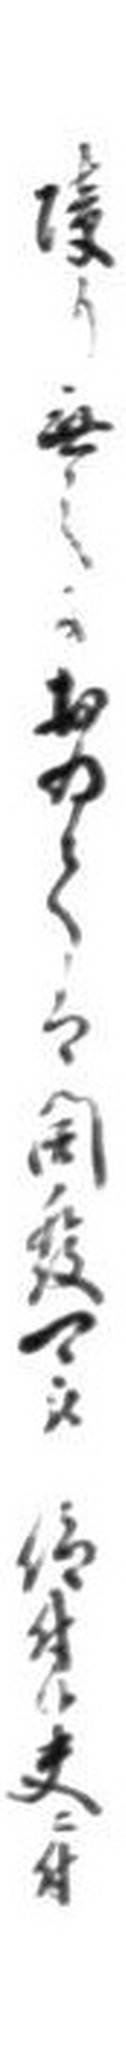障り無之におゐては開発可被仰付候夫ニ付
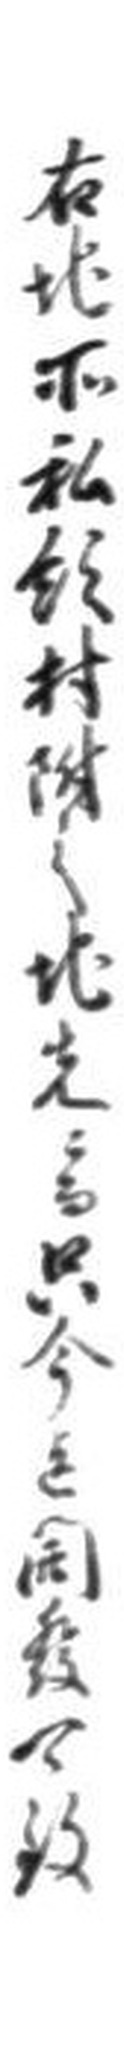右地所私領村附之地先ニ而只今迄開発可致

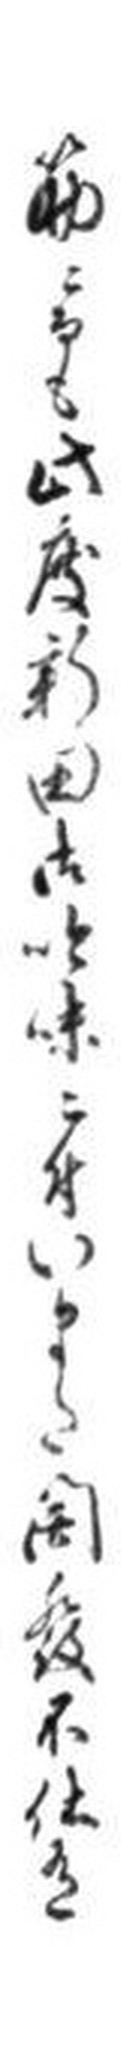筋ニ而も此度新田御吟味ニ付いまた開発不仕有
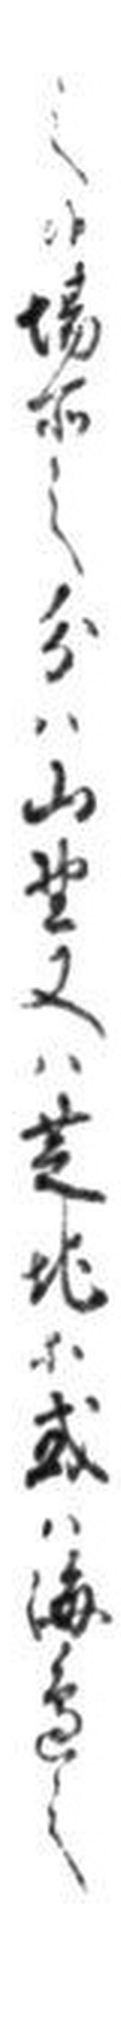之候場所之分ハ山野又ハ芝地等或ハ海辺之
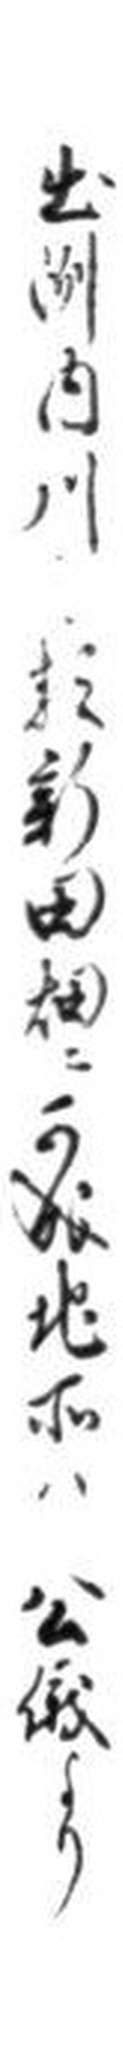出洲内川之類新田畑ニ可成地所ハ公儀より
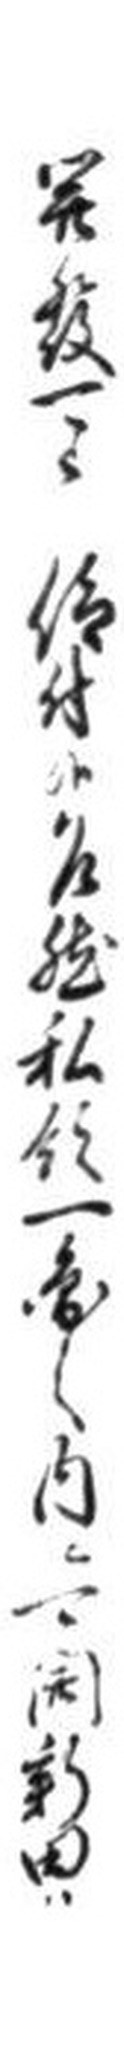開発可被仰付候乍然私領一円之内ニ可開新田ハ
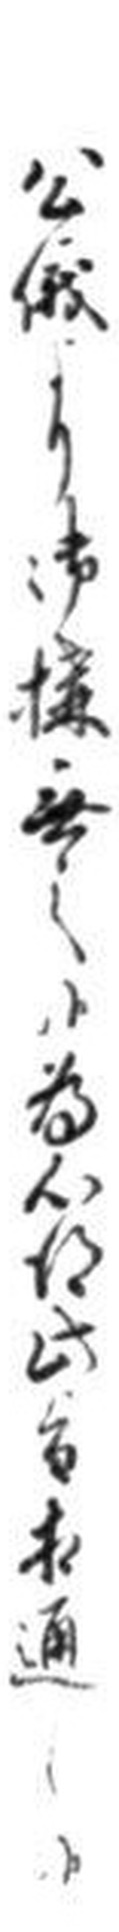公儀より御構無之候為心得此旨相通し候
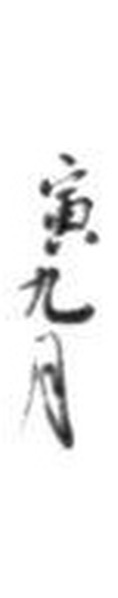寅九月
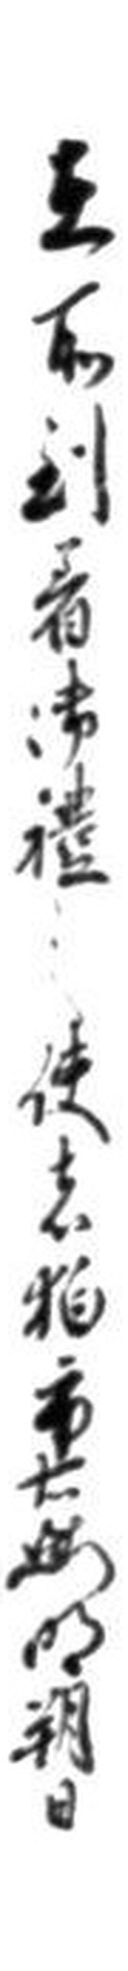在所到着御礼之使者狛市右衛門明朔日
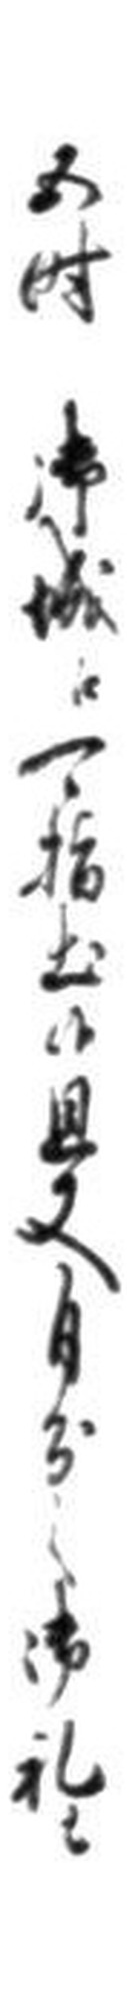五時御城江可指出候且又自分之御礼も
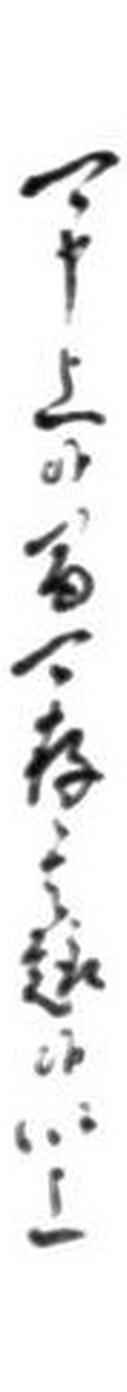可申上候間可存其趣候以上
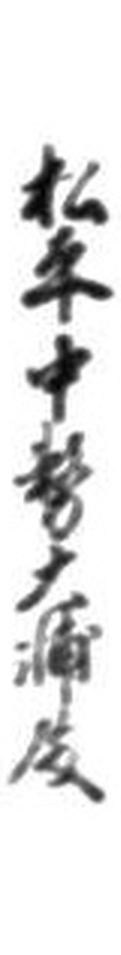松平中務大輔殿
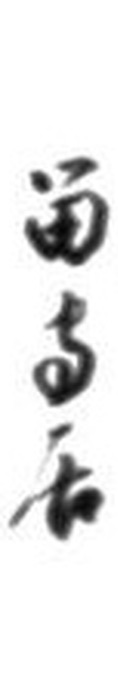留守居
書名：家譜 三十五 宗昌公 従享保六年到同七年
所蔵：福井県文書館 Fukui Prefectural Archives
